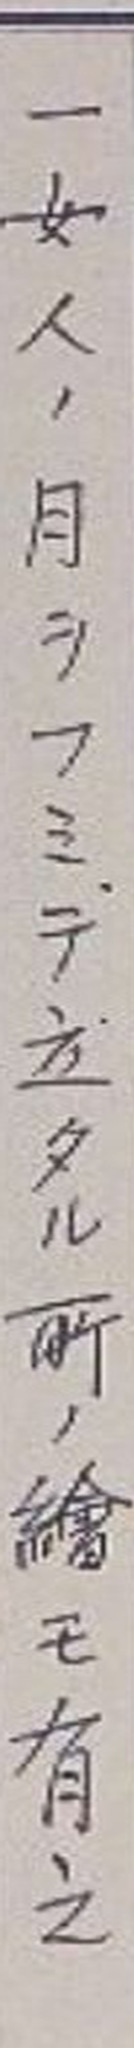一女人の月をふみて立たる所の絵も有之
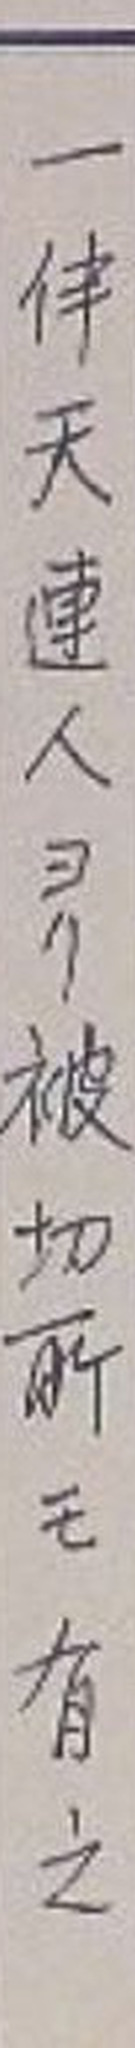一伴天連人より被切所も有之

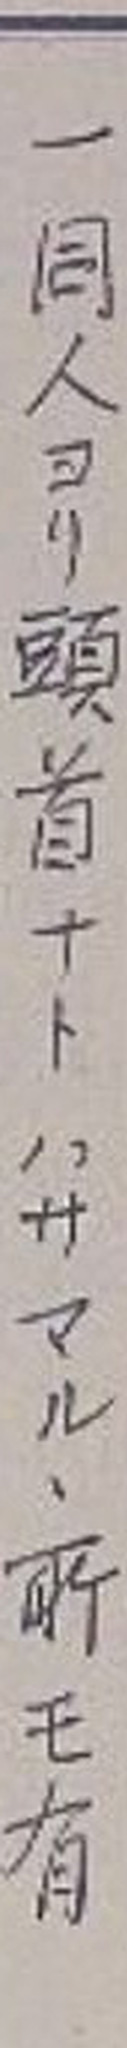一同人より頭首なとはさまるゝ所も有
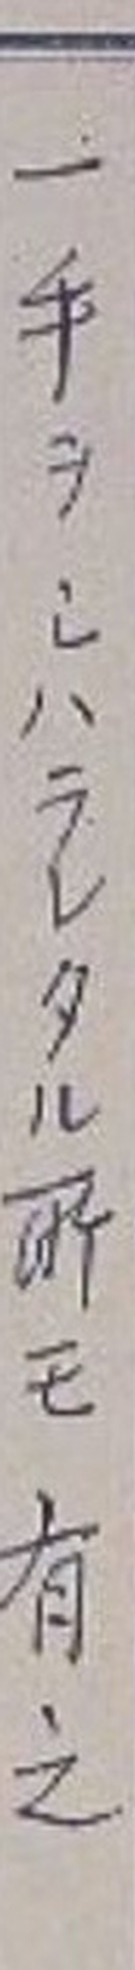一手をしはられたる所も有之
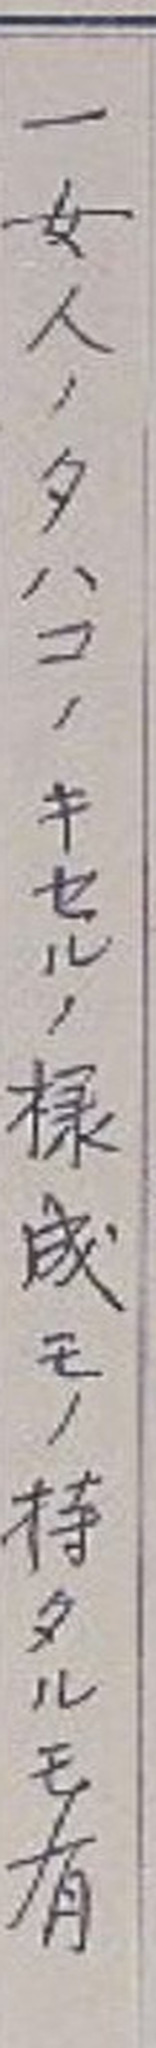一女人のたはこのきせるの様成もの持たるも有
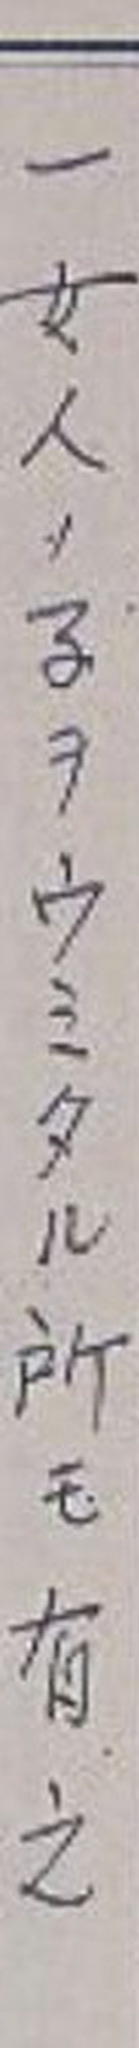一女人の子をうみたる所も有之
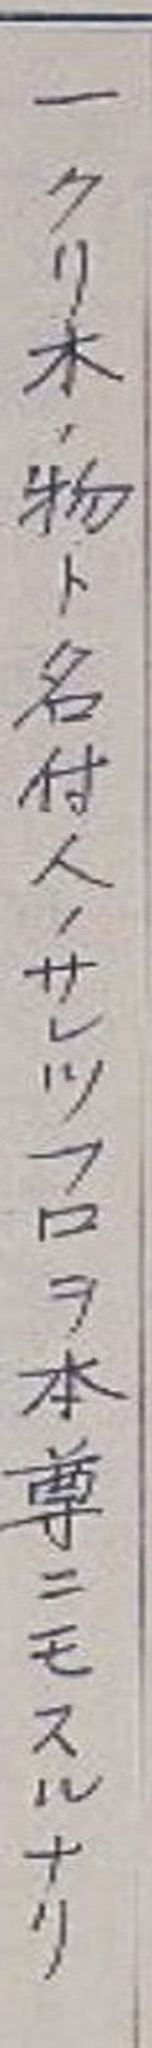一くり木の物と名付人のされつふろを本尊にもするなり
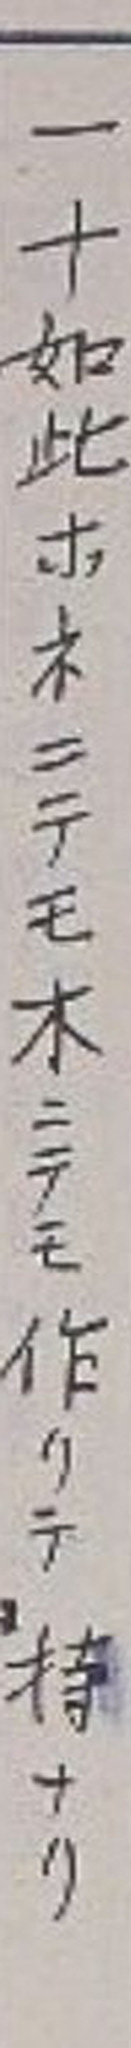一十如此ほねにても木にても作りて持なり
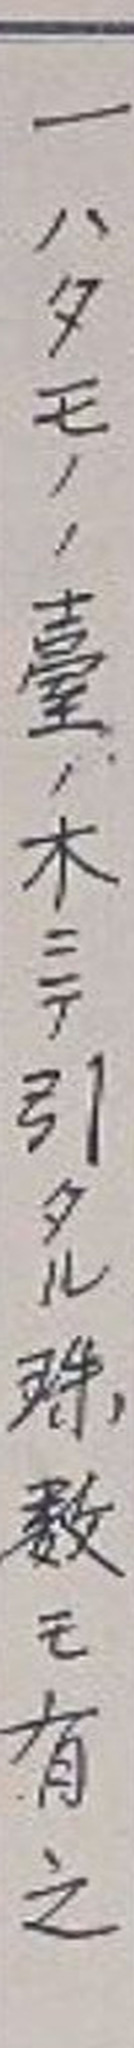一はたものの台の木にて引たる数珠も有之
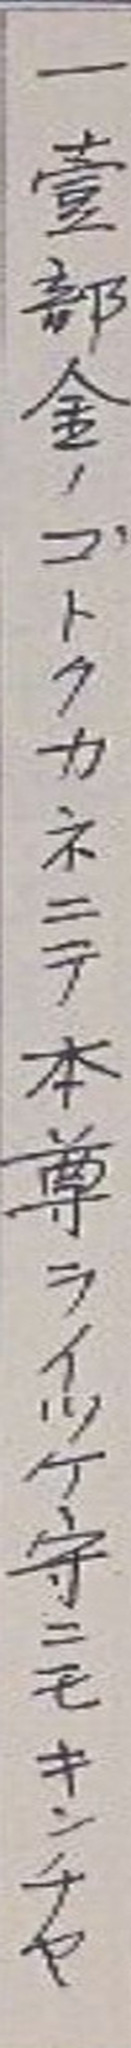一壱部金のごとくかねにて本尊らいつけ守にもきんちや
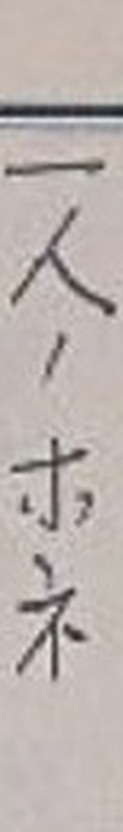一人のほね
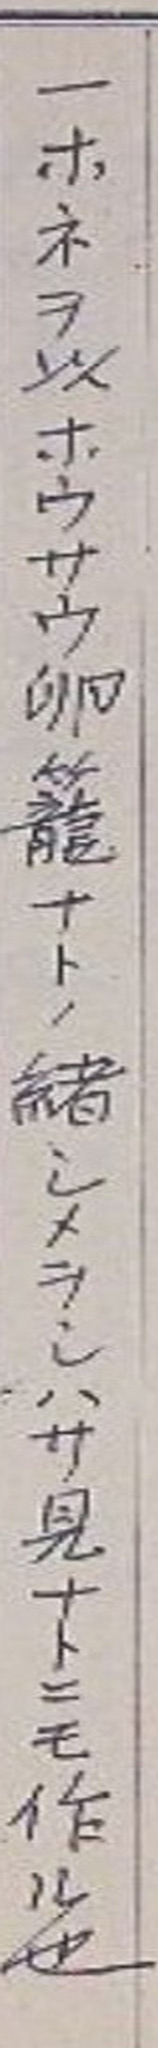一ほねを以ほうさう卵籠なとの緒しめられはさ見なとにも作る也
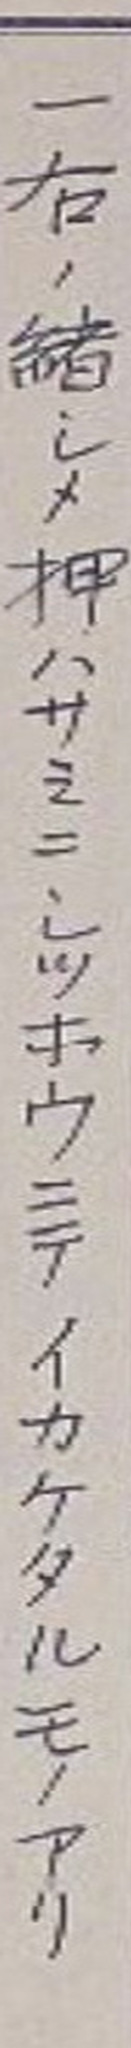一右の緒しめ押はさみにしつほうにていかけたるものあり
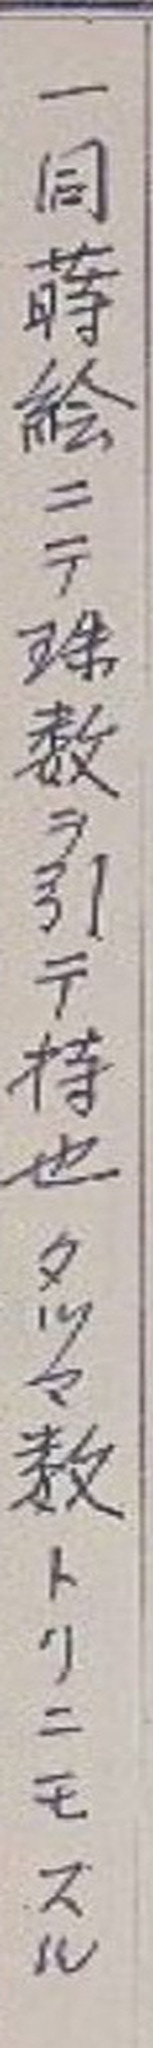一同蒔絵にて数珠を引て持也たつま数とりにもする
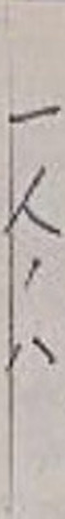一人のは
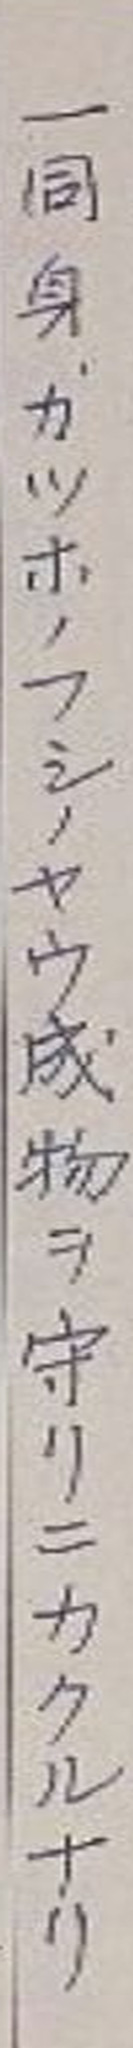一同身かつほのふしのやう成物を守りにかくるなり
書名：支那冊封使来琉諸記 下巻
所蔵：University of the Ryukyus Library
